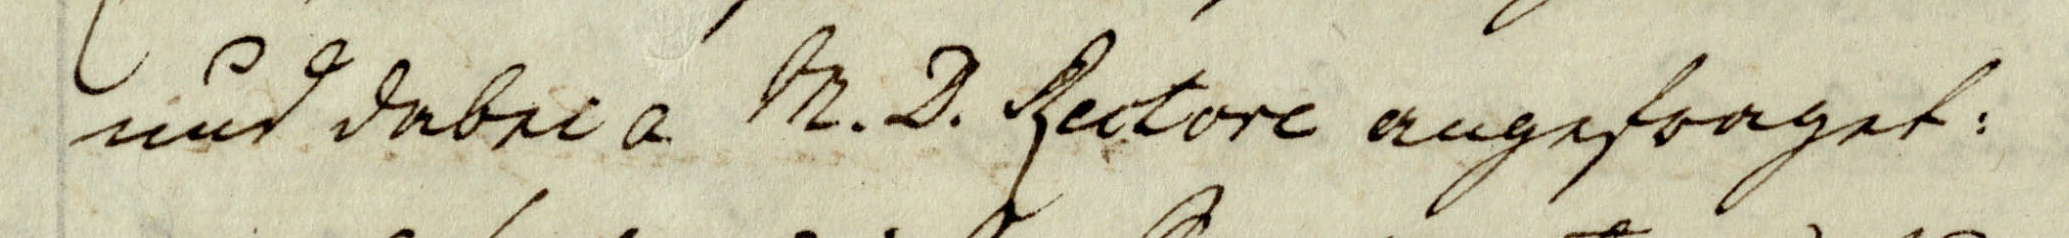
und dabei a M. D. Rectore angefraget:
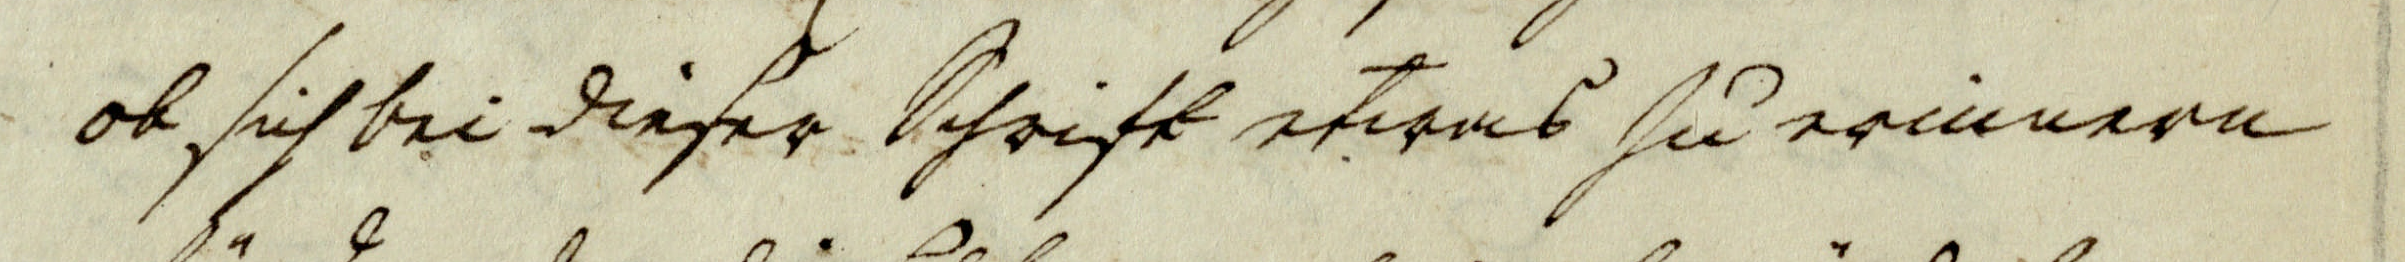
ob sich bei dieser Schrift etwas zu erinnern
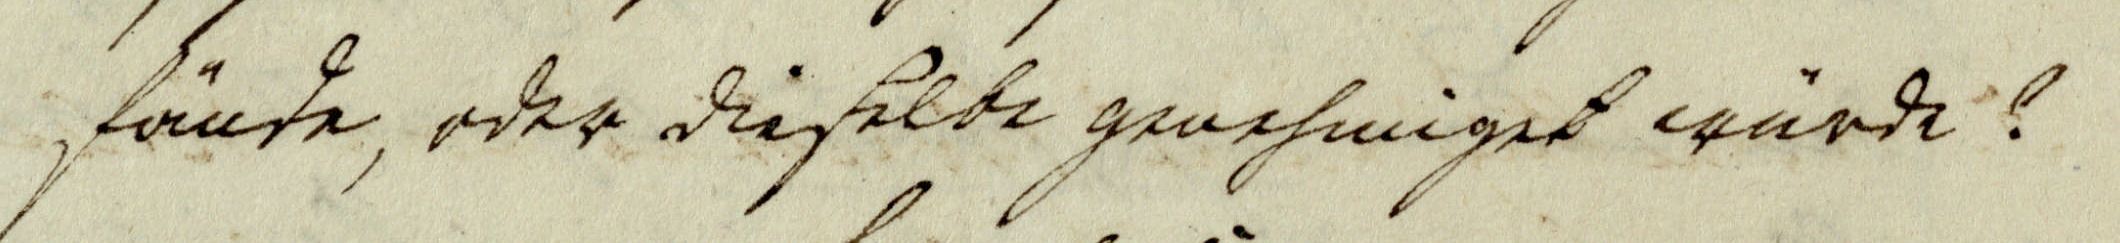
fände, oder dieselbe genehmiget würde?
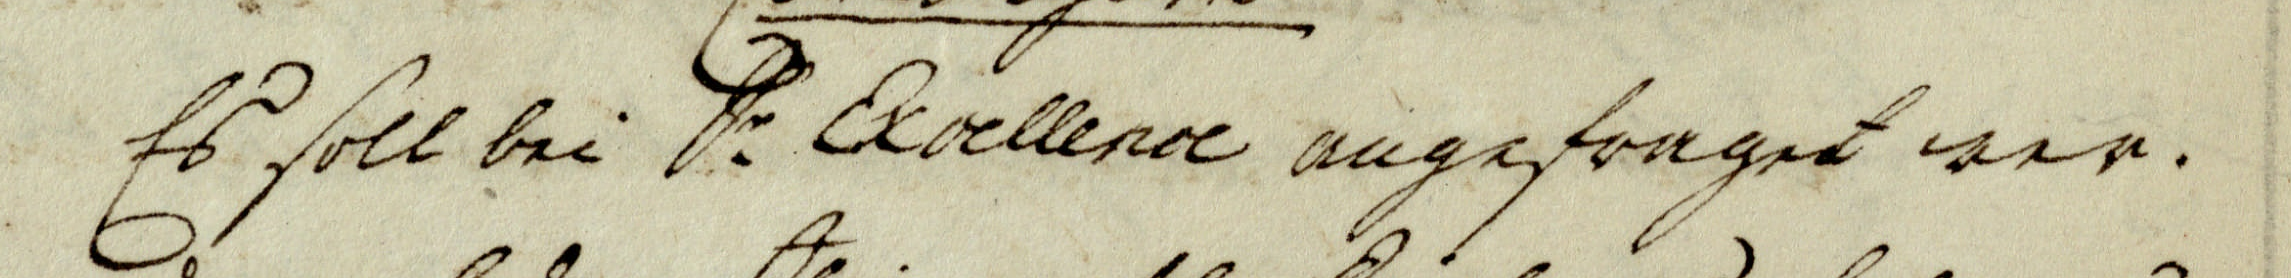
Es soll bei Sr. Excellence angefraget wer¬
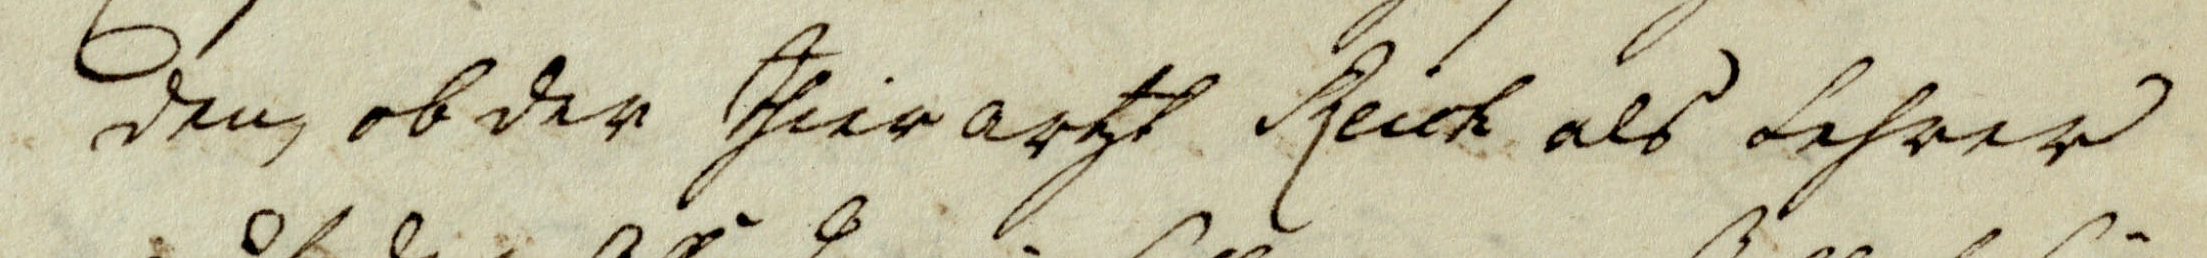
den, ob der Thierartzt auch als Lehrer
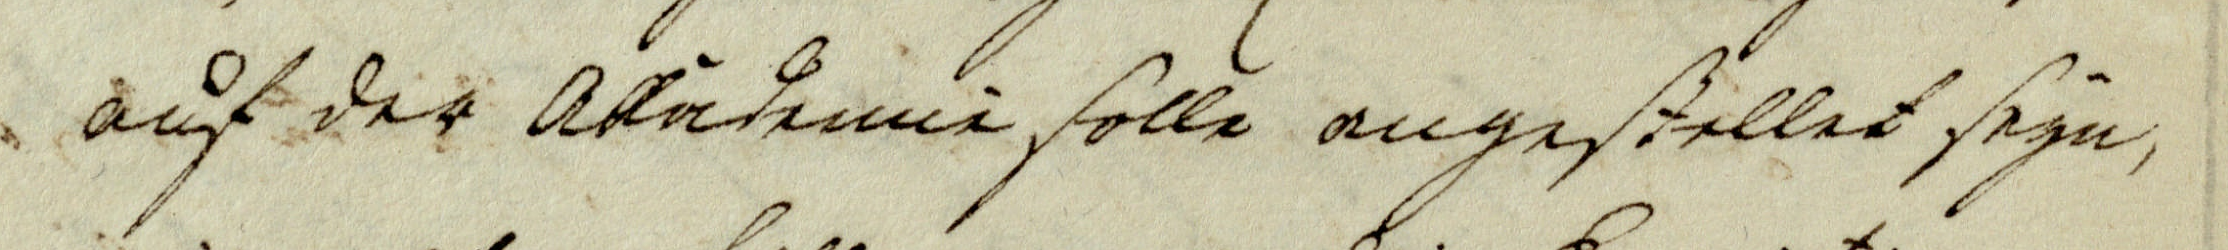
auf der Akademie solle angestellet seÿn,
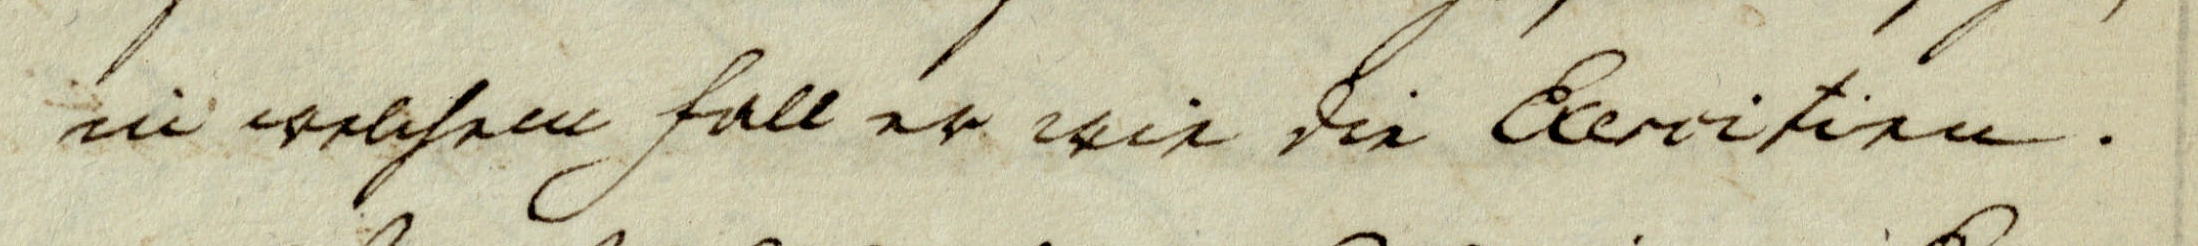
in welchem Fall er wie die Exercitien¬
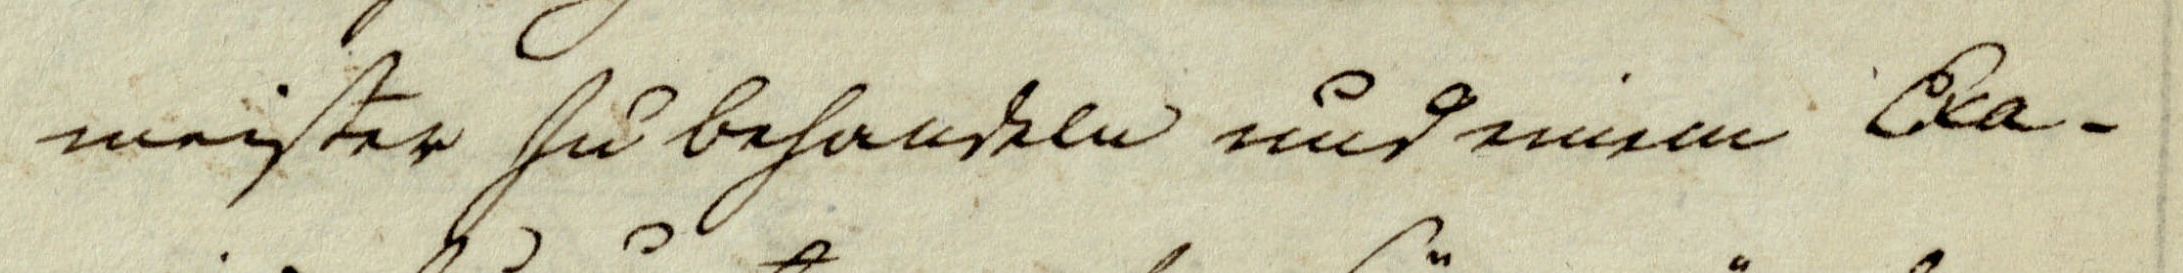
meister zu behandeln und einem Exa¬
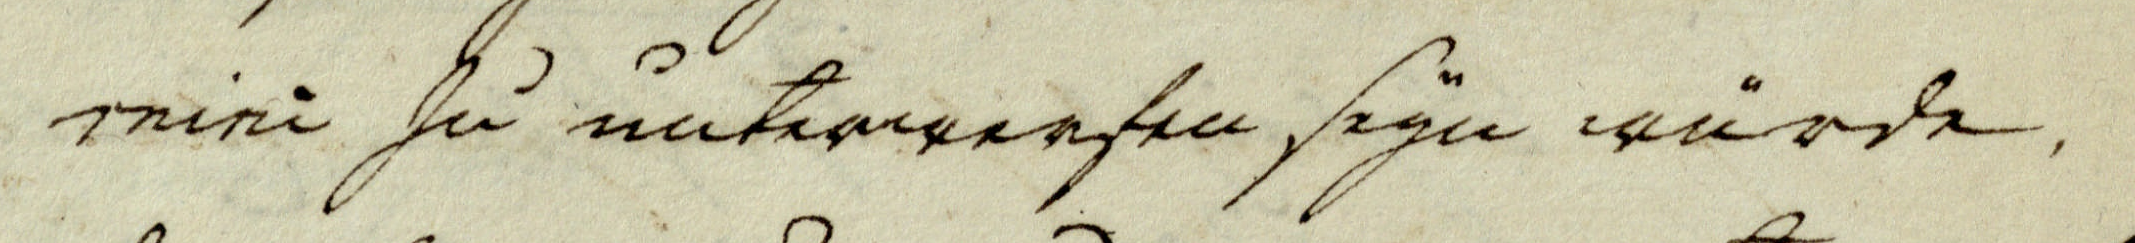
mini zu unterwerfen seÿn würde,
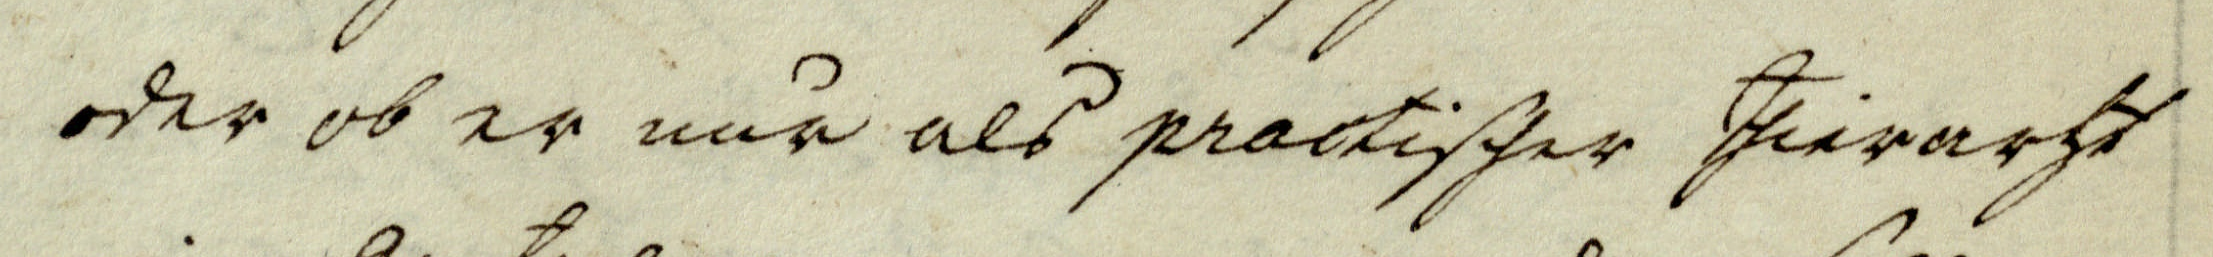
oder ob er nur als practischer Tierartzt
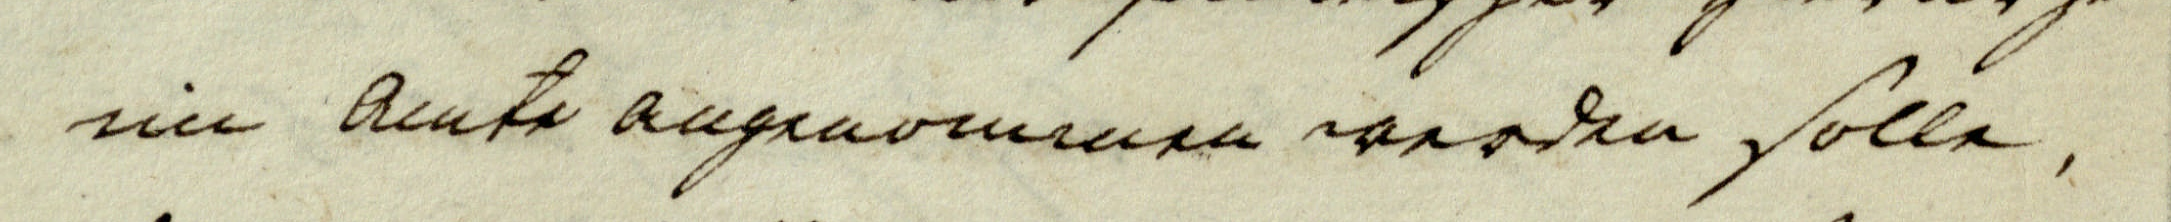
im Amte angenommen werden solle,
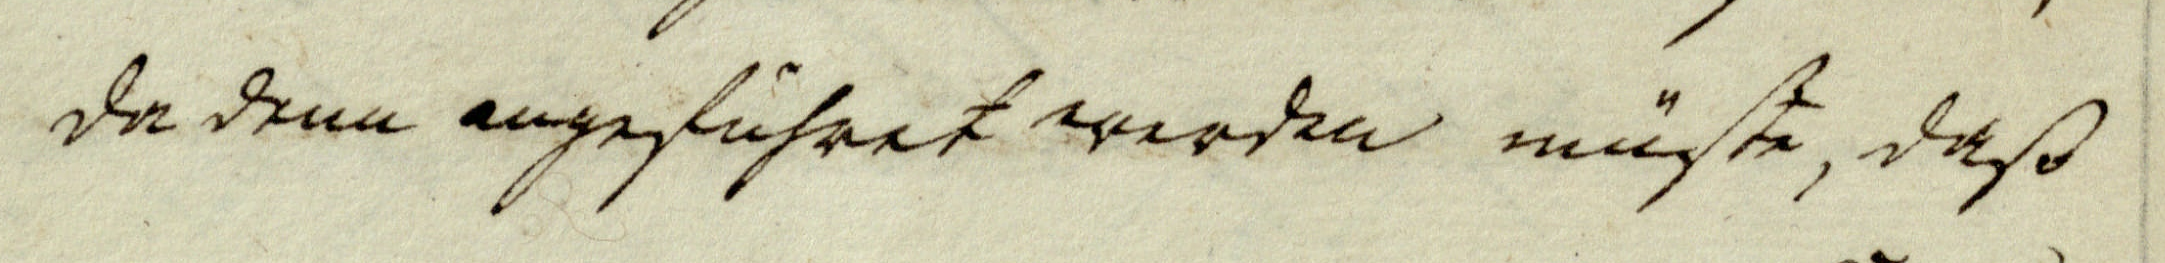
da denn angeführet werden müßte, daß
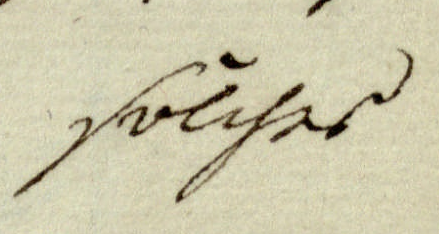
solches
